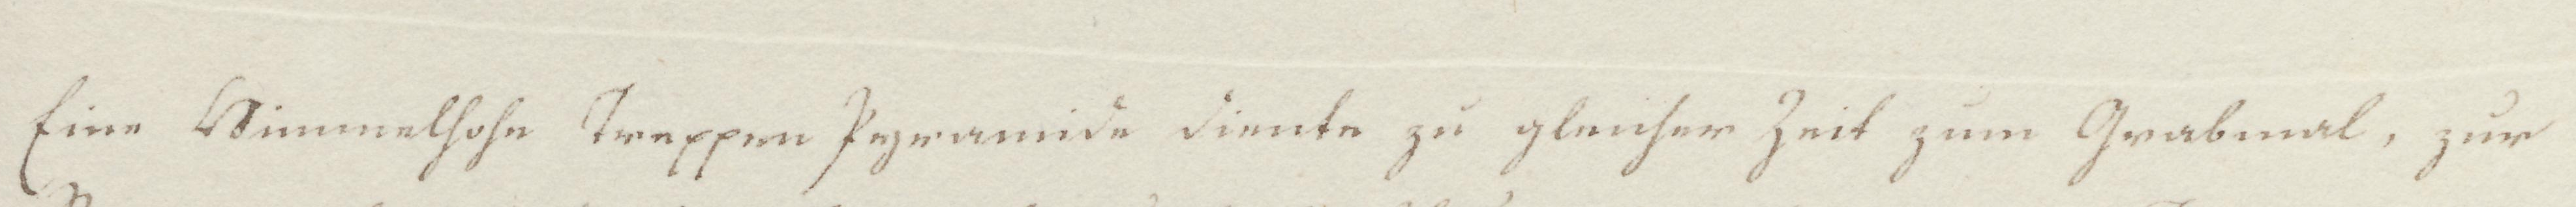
Eine Himmelhohe Treppen Pyramide diente zu gleicher Zeit zum Grabmal, zur
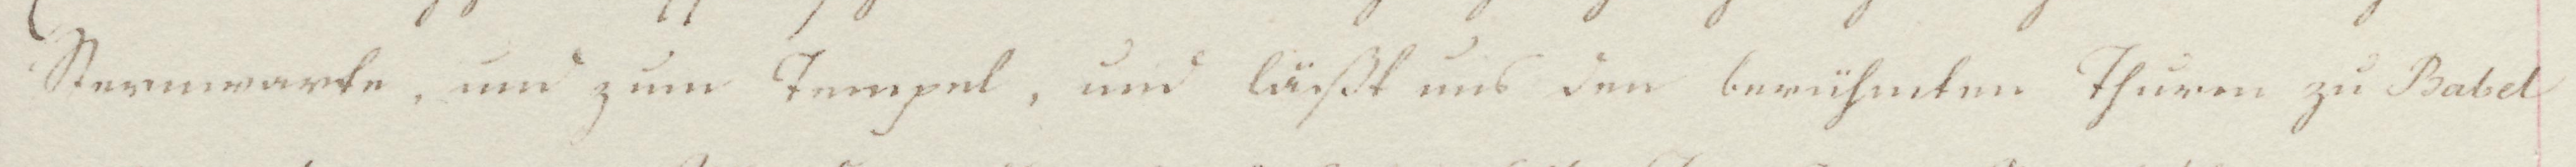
Sternwarte, und zum Tempel, und läßt uns den berühmten Thurm zu Babel
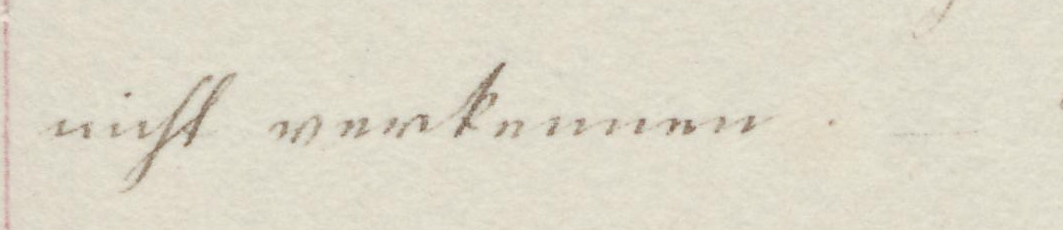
nicht verkennen. –
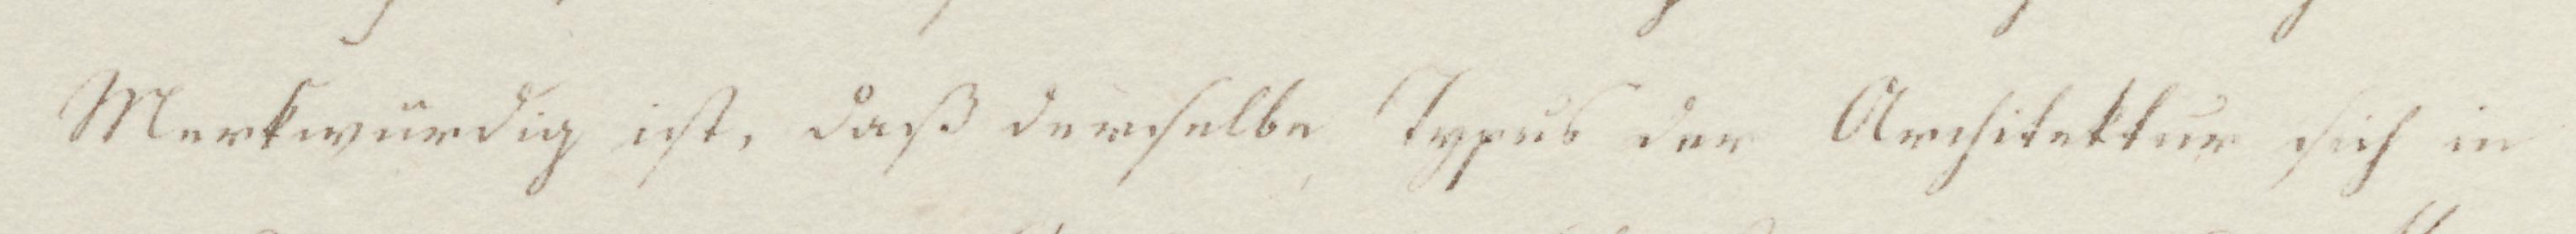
Merkwürdig ist, daß derselbe Typus der Architektur sich in
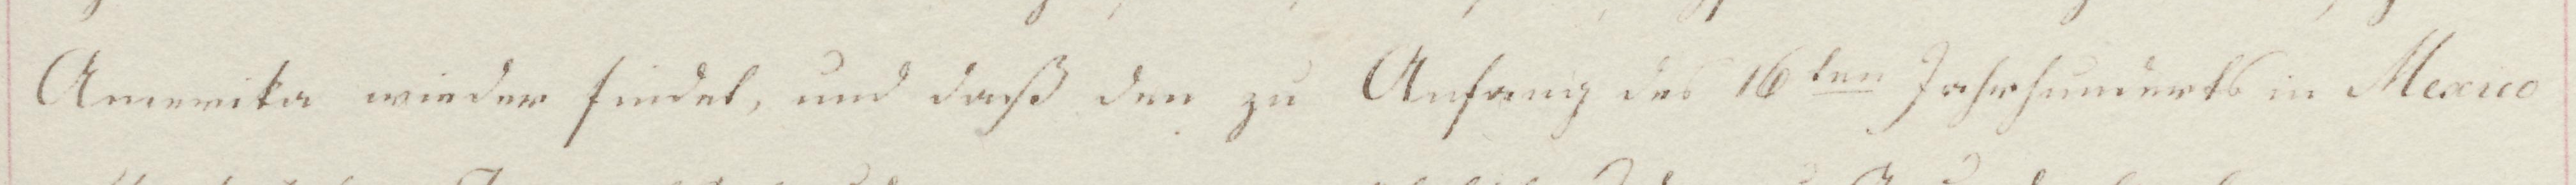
Amerika wieder findet, und daß den zu Anfang des 16ten Jahrhunderts in Mexico
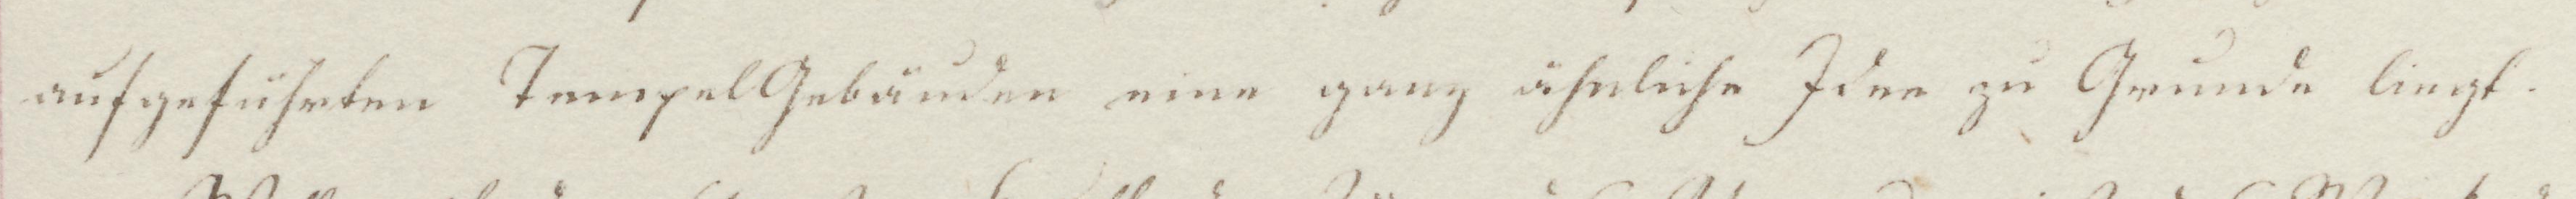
aufgeführten TempelGebäuden eine ganz ähnliche Idee zu Grunde liegt.
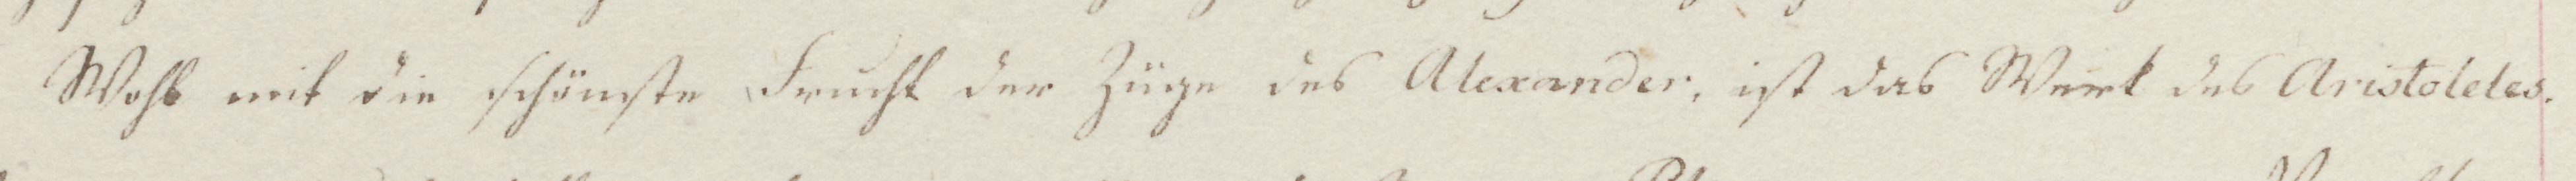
Wohl mit die schönste Frucht der Züge des Alexander, ist das Werk des Aristoteles.
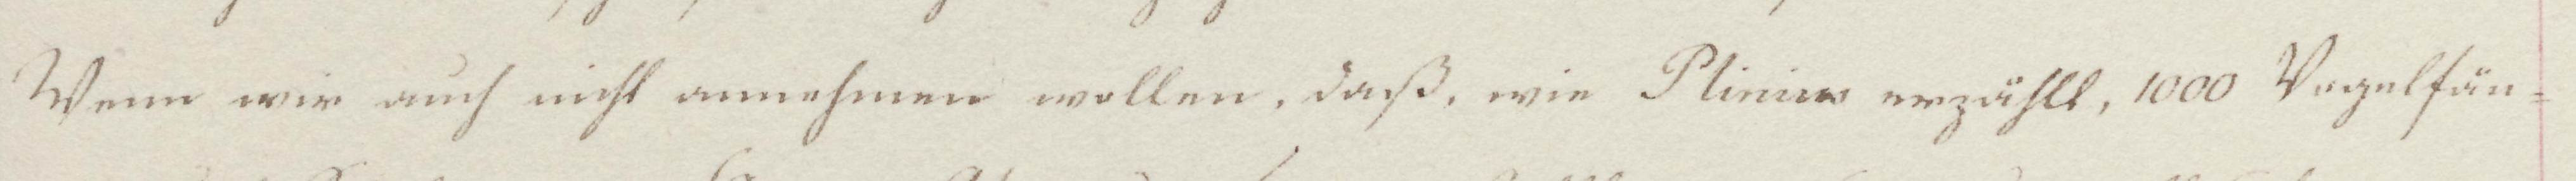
Wenn wir auch nicht annehmen wollen, daß, wie Plinius erzählt, 1000 Vogelfän-
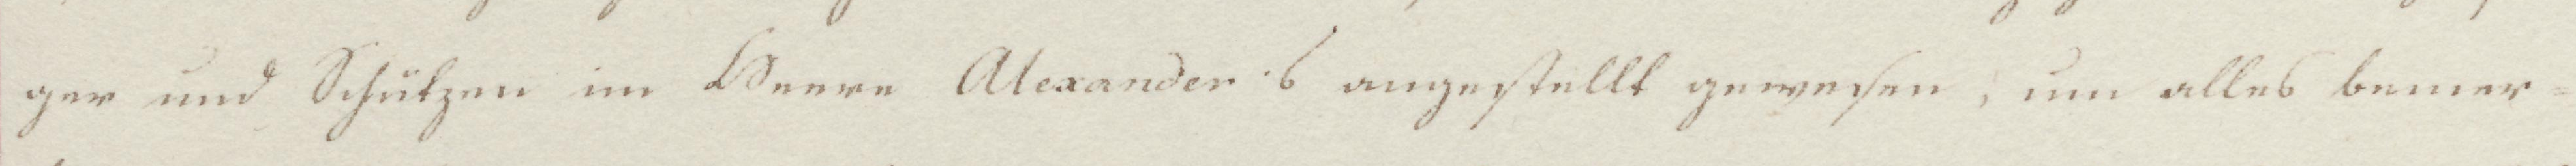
ger und Schützen im Heere Alexander's angestellt gewesen, um alles bemer-
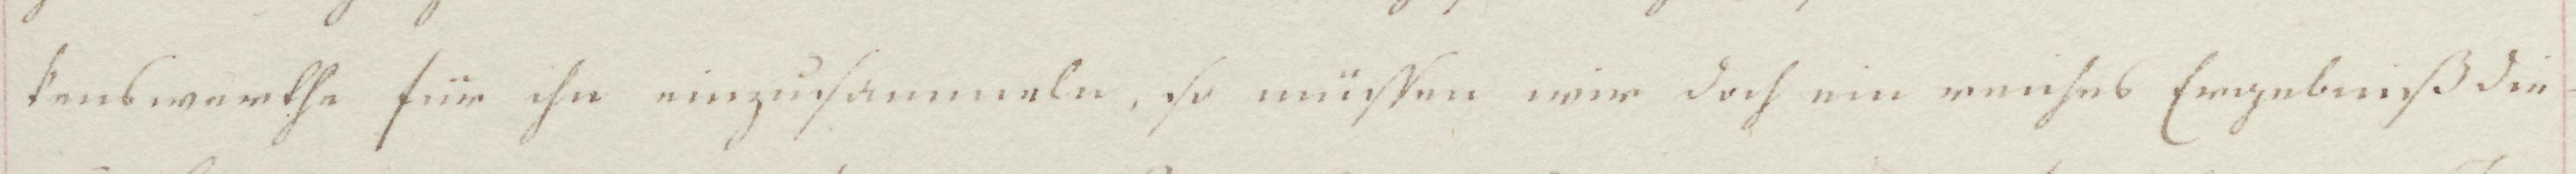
kenswerthe für ihn einzusammeln, so müssen wir doch ein reiches Ergebniß die-
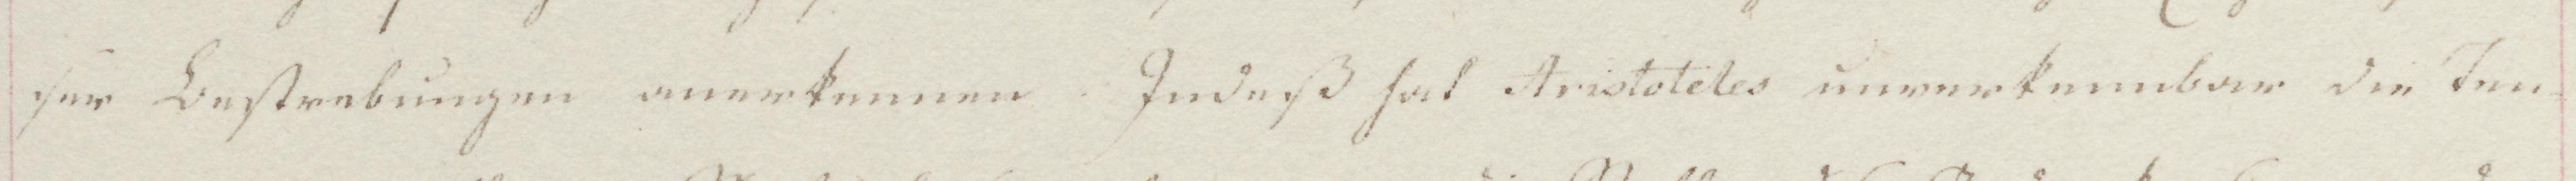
ser Bestrebungen anerkennen. Indeß hat Aristoteles unverkennbar die Ten-
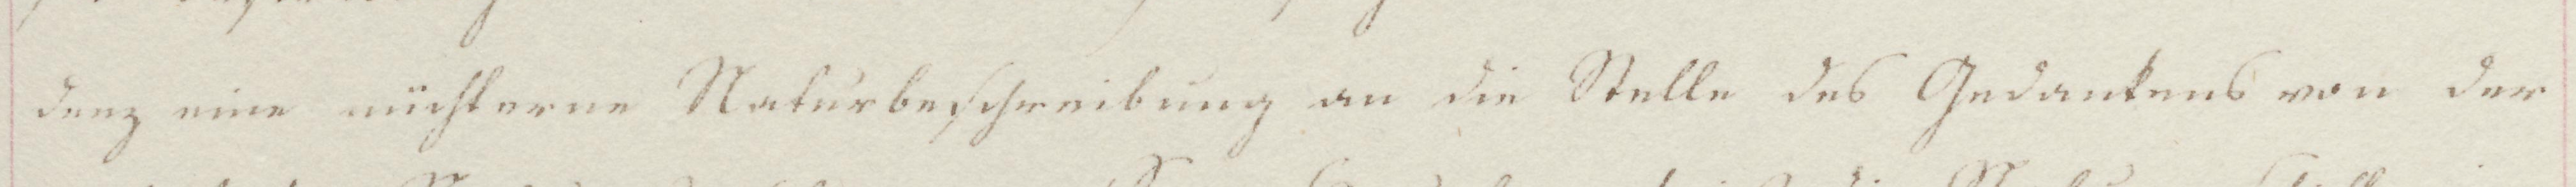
denz eine nüchterne Naturbeschreibung an die Stelle des Gedankens von der
